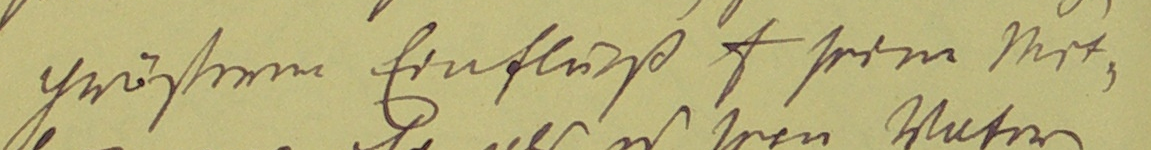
größerem Einfluss auf seine Mit¬
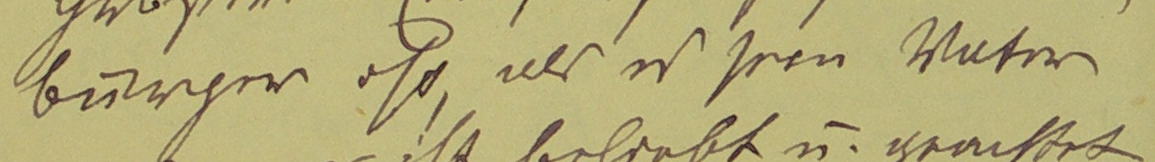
bürger ist, als es sein Vater
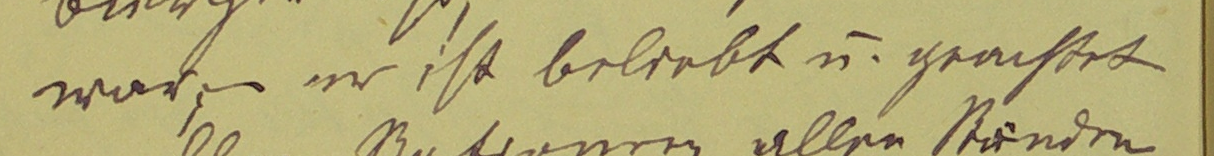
war, er ist beliebt und geachtet
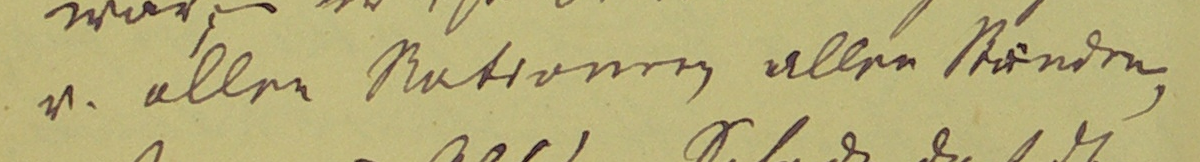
von allen Nationen allen Ständen,
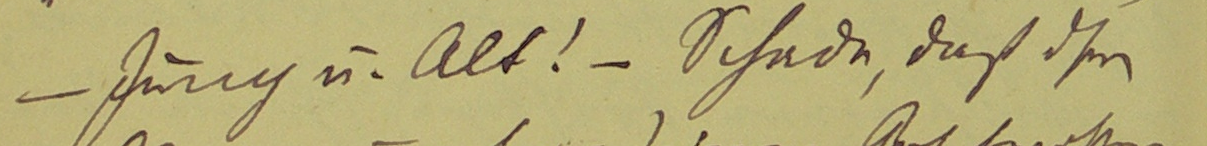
- Jung und Alt,- Schade, daß dieser
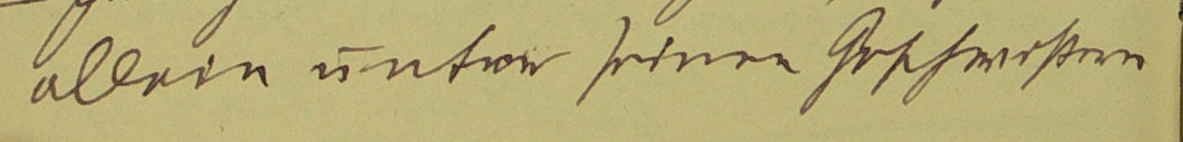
allein unter seinen Geschwistern
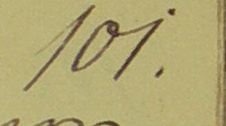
101
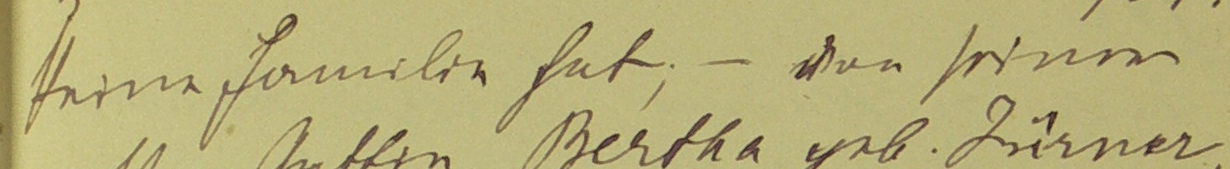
keine Familie hat;- Von seiner
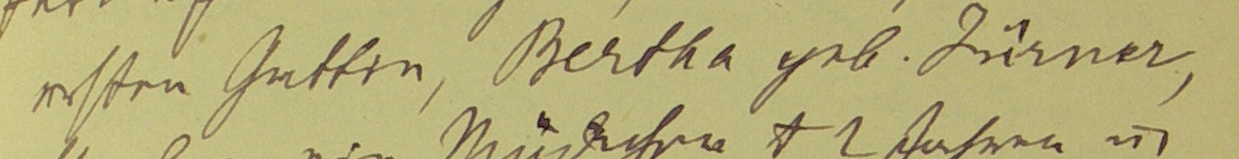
ersten Gattin, Bertha geb. Zirner
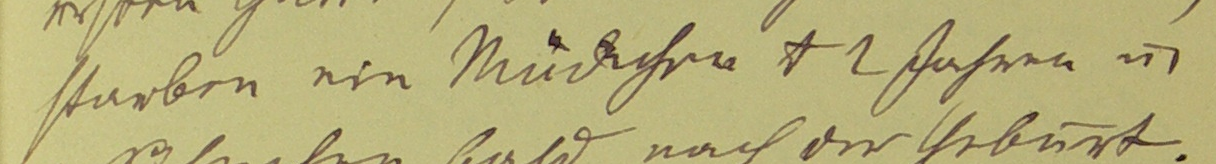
starben ein Mädchen mit 2 Jahren und
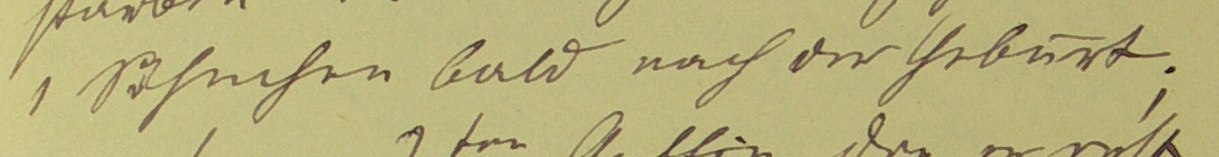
ein Söhnchen bald nach seiner Geburt.,
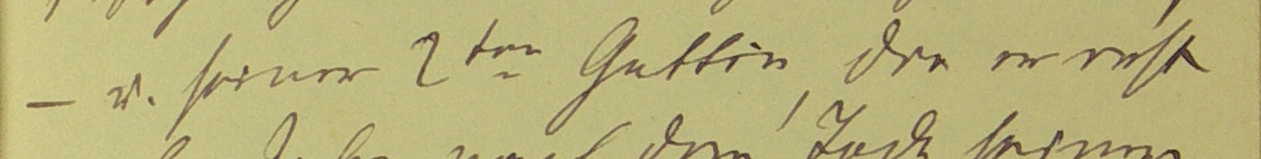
-von seiner 2-ten Gattin die er erst
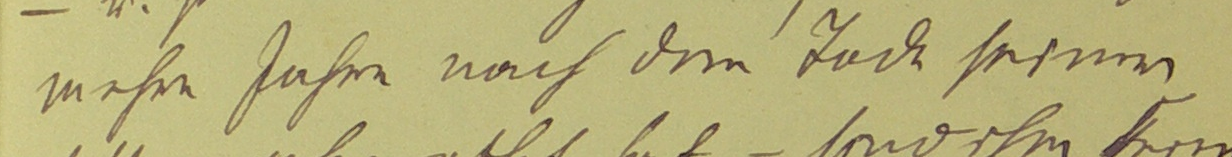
mehrere Jahre nach dem Tod seiner
